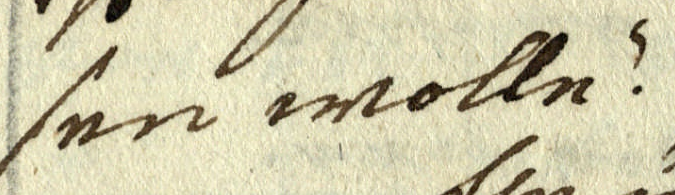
sen wolle?
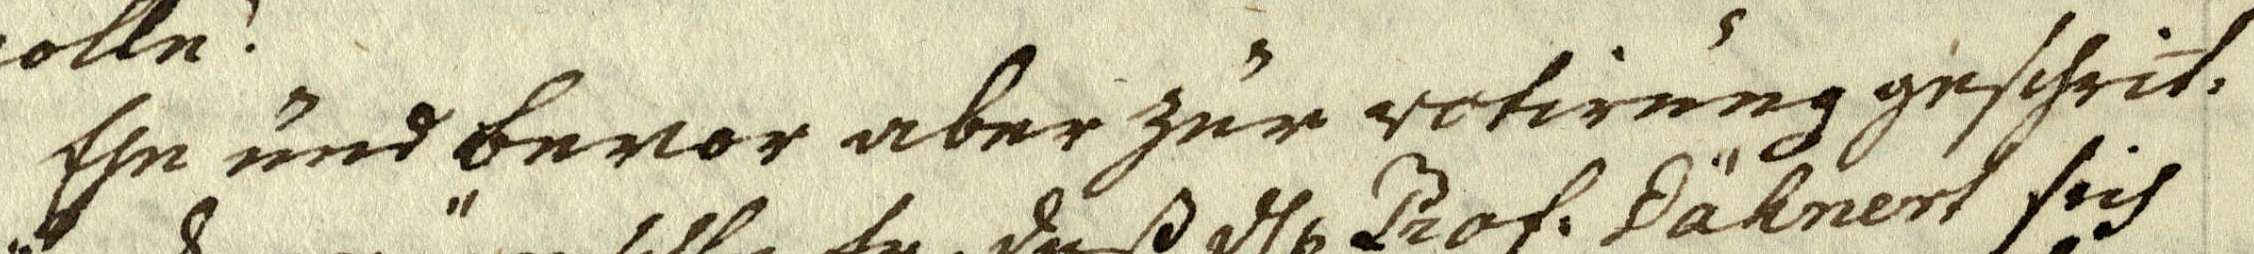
Ehe und bevor aber zur votirung geschrit¬
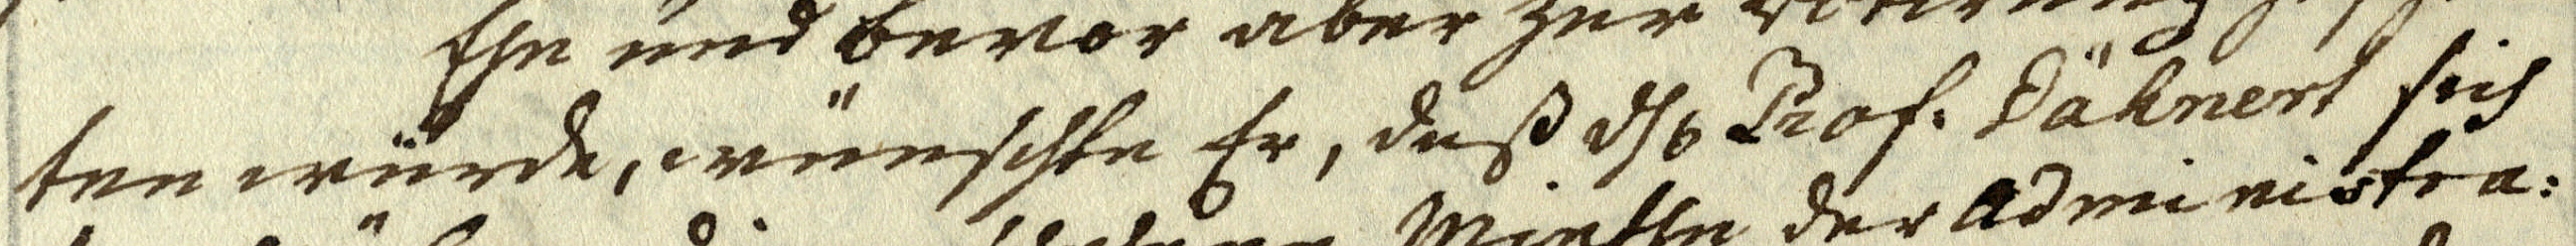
ten würde, wünschte Er, daß dh. Prof. Dähnert sich
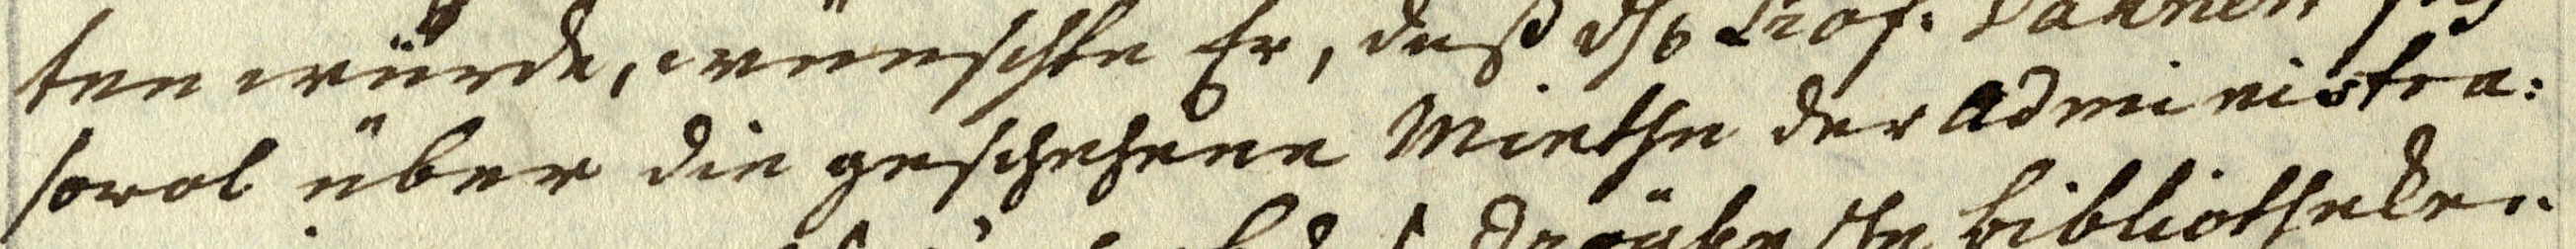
sowol über die geschehene Miethe der Administra¬
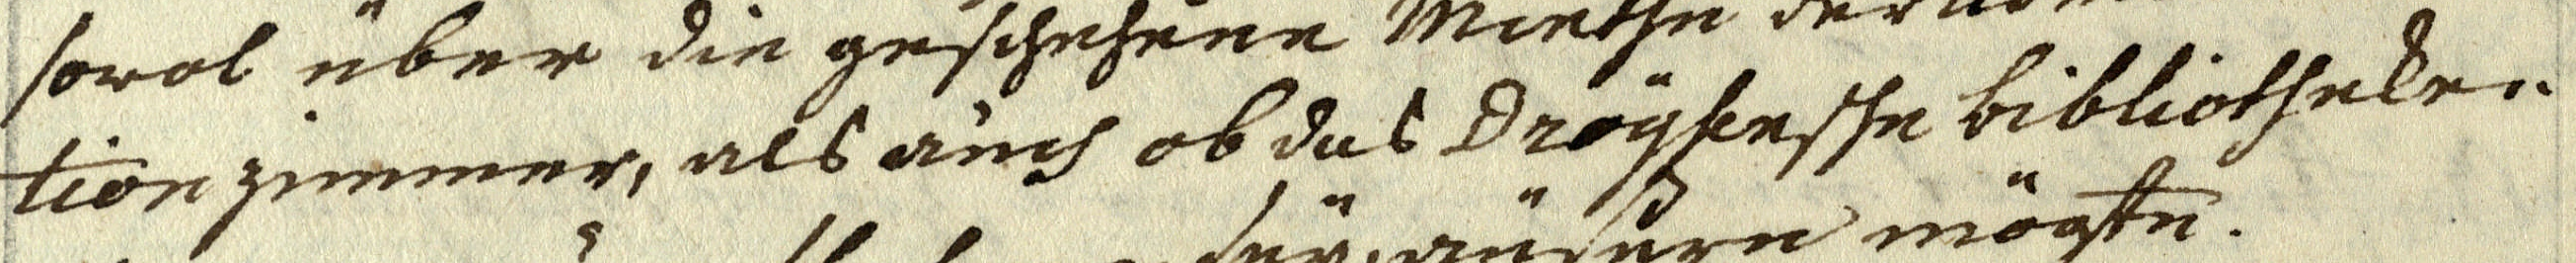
tion zimmer, als auch ob das Droÿsensche Bibliotheken
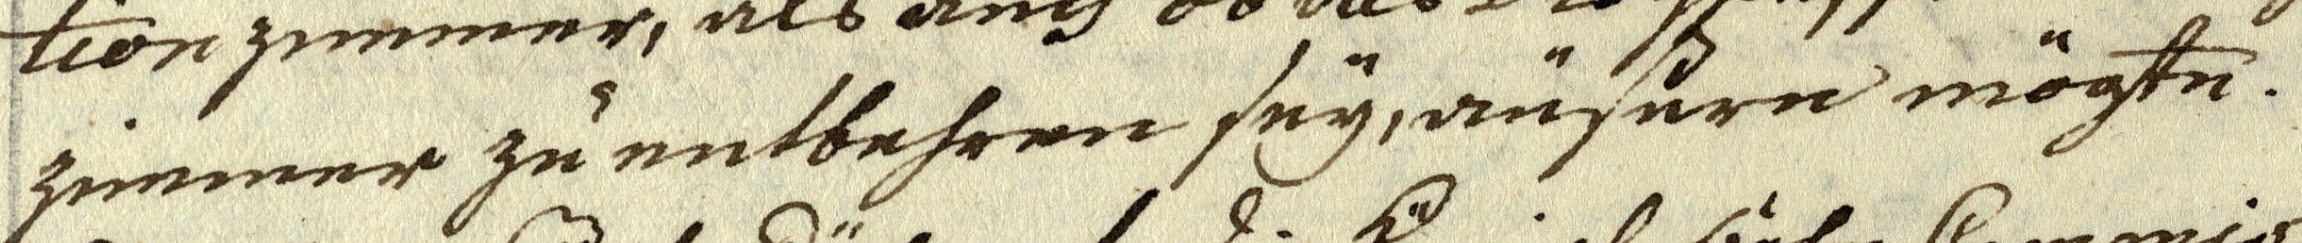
zimmer zu entbehren seÿ, äußern mögte.
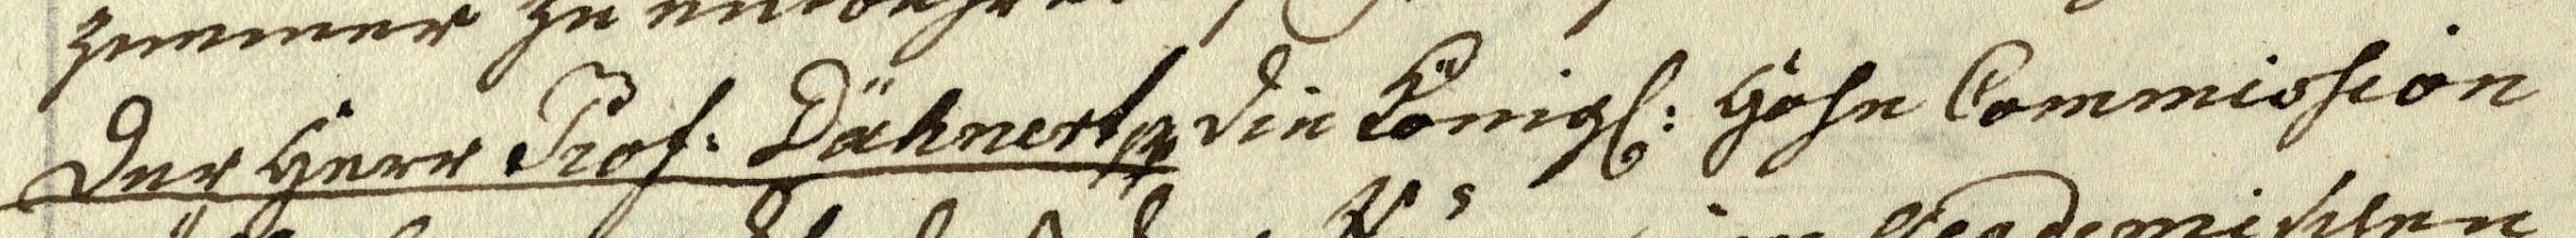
Der Herr Prof. Dähnert pp die Königl. Hohe Commission
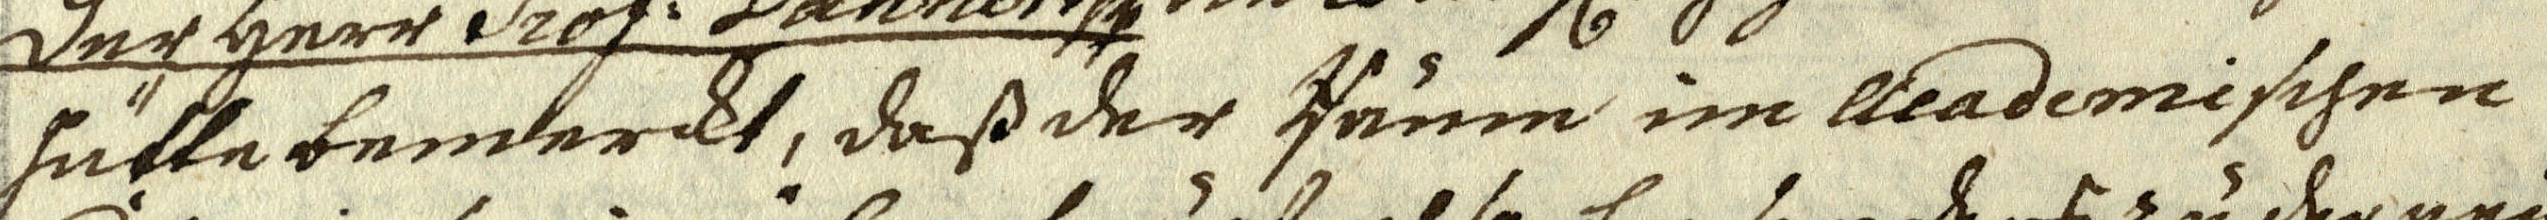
hätte bemerckt, daß der Raum im Academischen
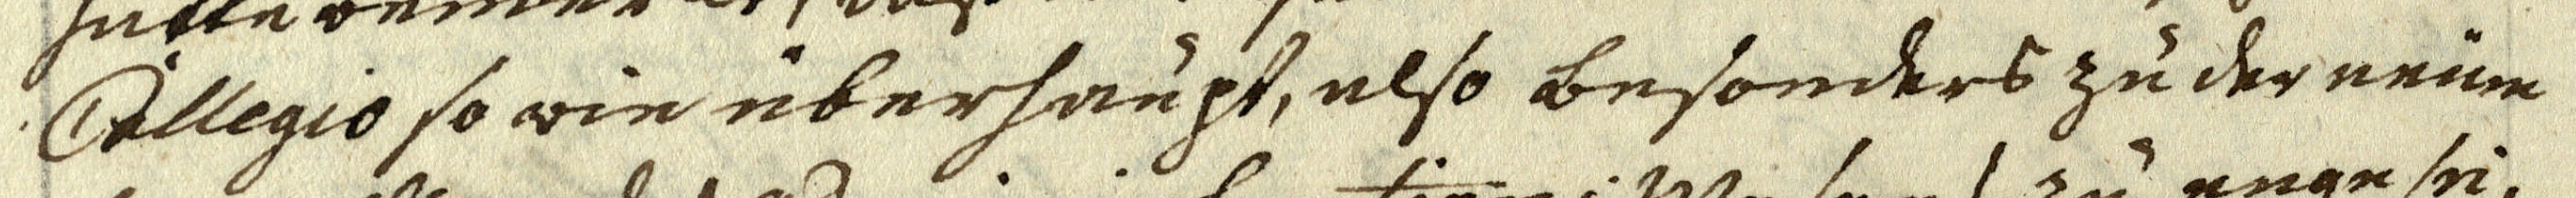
Collegio so wie überhaupt, also besonders zu der neuen
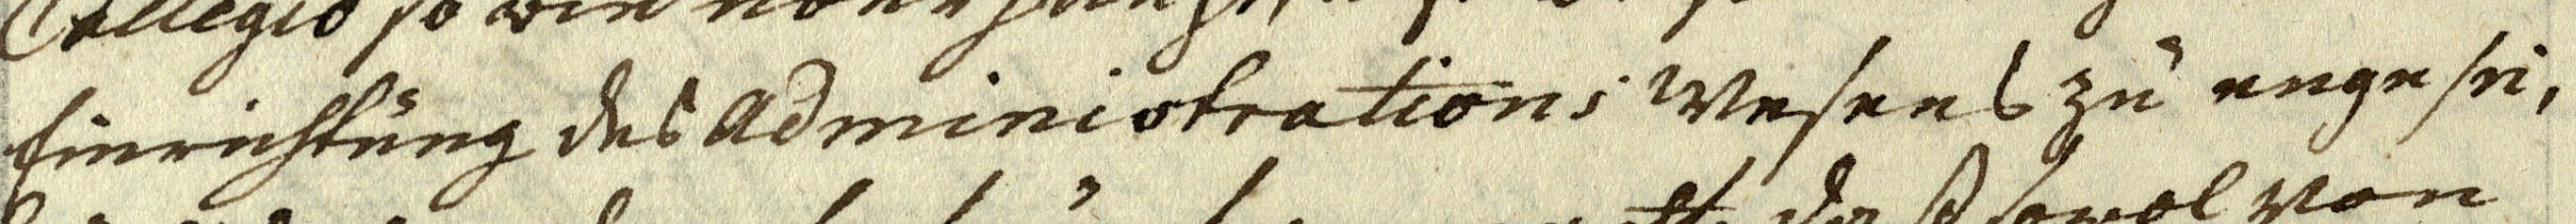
Einrichtung des Adminstrations Wesens zu enge sei,
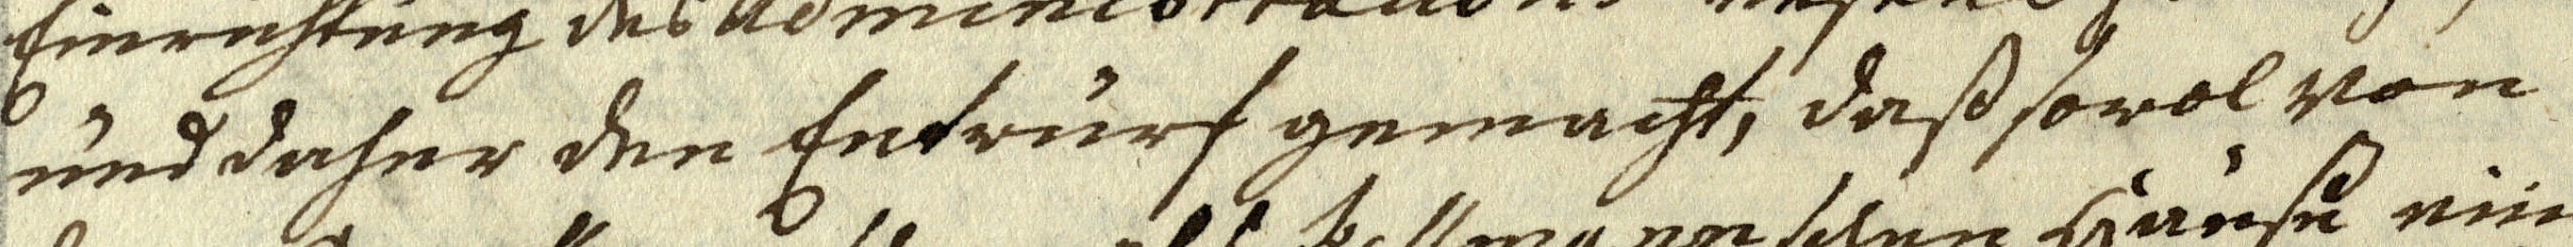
und daher den Entwurf gemacht, daß sowol von
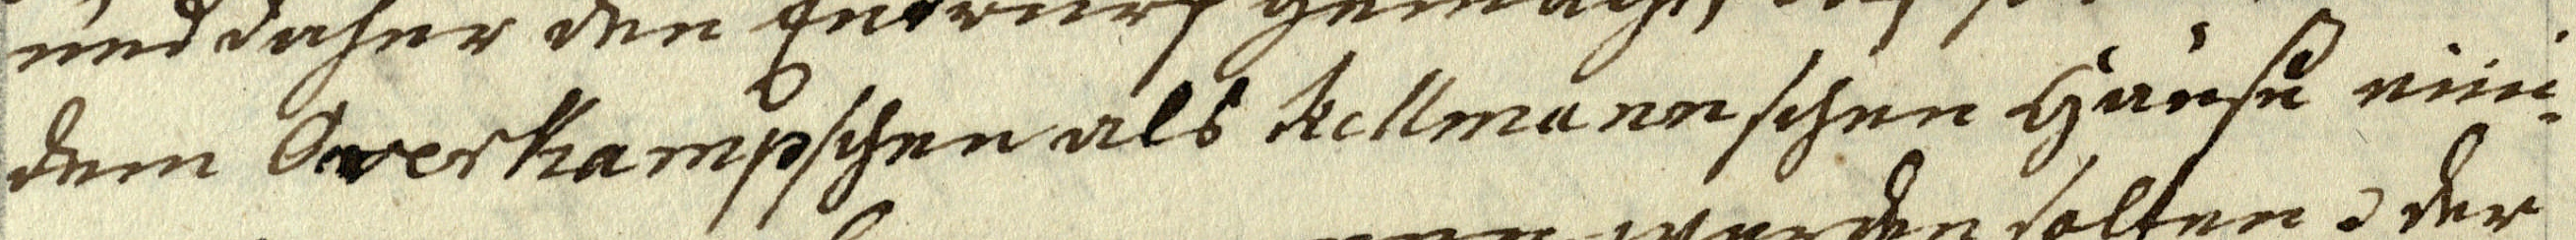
dem Overkampschen als Kellmannschen Hauße eini¬
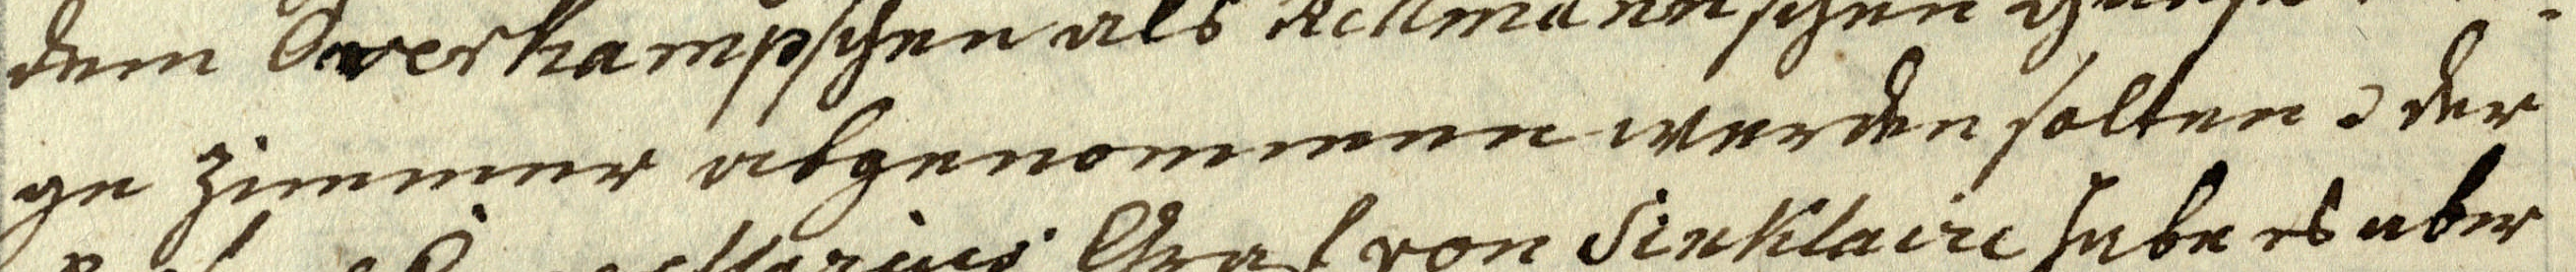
ge Zimmer abgenommen werden solten. Der
